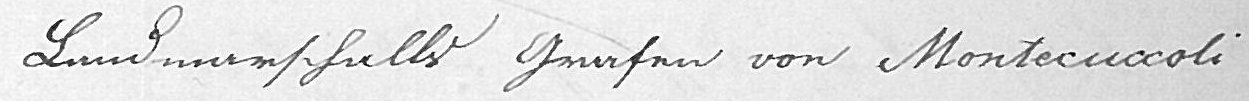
Landmarschall Grafen von Montecuccoli
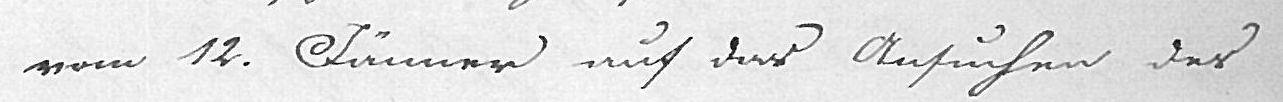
vom 12. Jänner aut das Ansuchen des
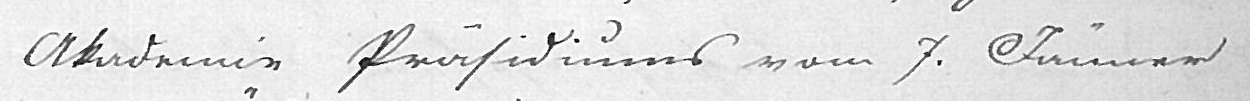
Akademie-Präsidiums vom 7. Jänner
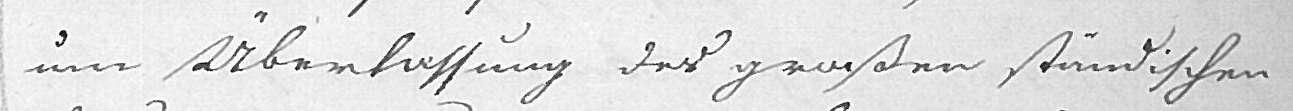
um Überlassung des großen ständischen
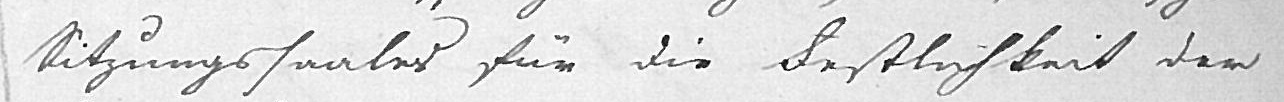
Sitzungsaales für die Festlichkeit der
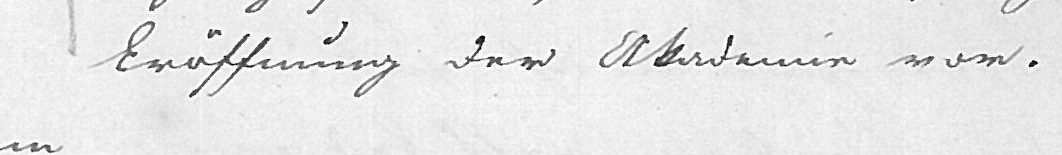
Eröffnung der Akademie vor.
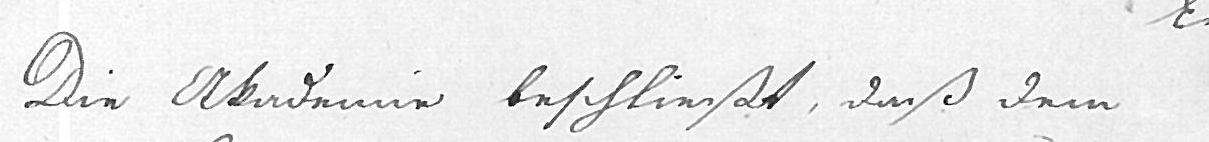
Die Akademie beschließt, daß dem
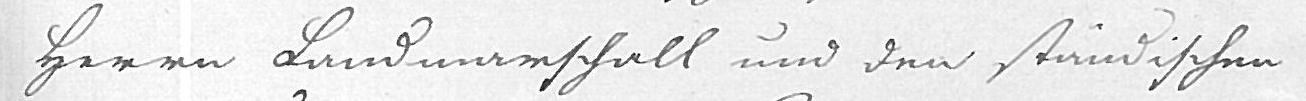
Herrn Landmarschall und den ständischen
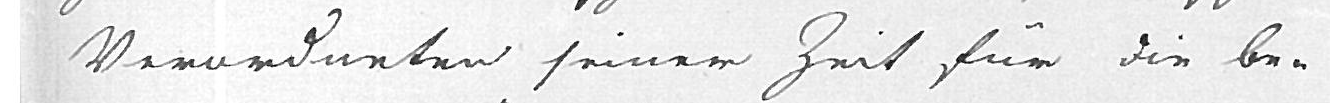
Verordneten seiner Zeit für die be-
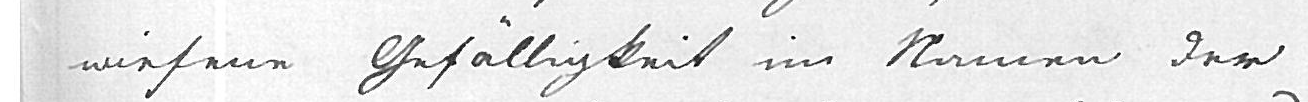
wiesene Gefälligkeit im Namen der
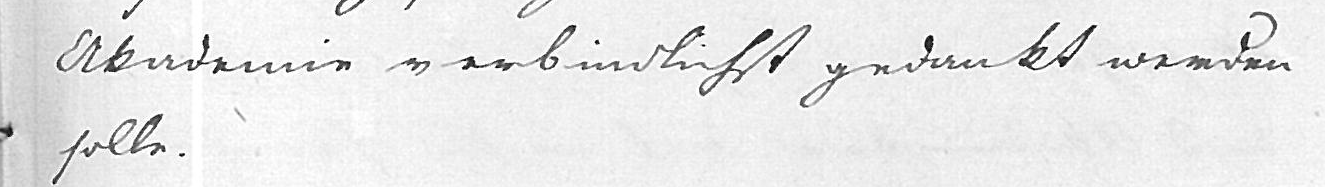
Akademie verbindlichst gedankt werden
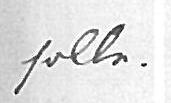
solle
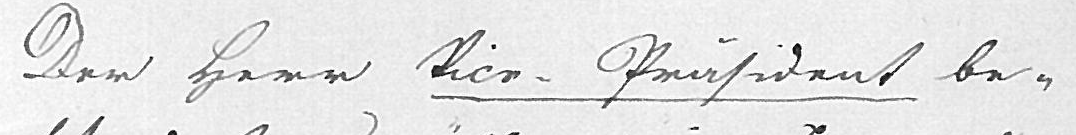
Der Herr Vice-Präsident be-
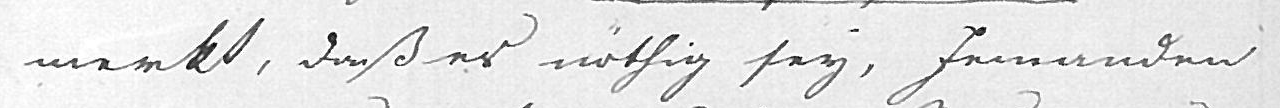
merkt, daß es nöthig sey, Jemanden
